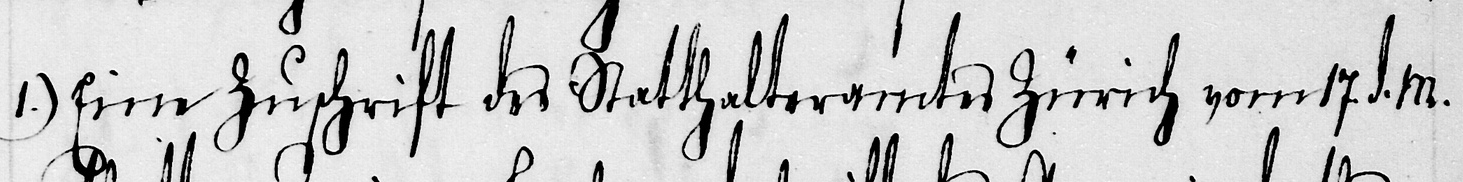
1.) Eine Zuschrift des Statthalteramtes Zürich vom 17. d. M.
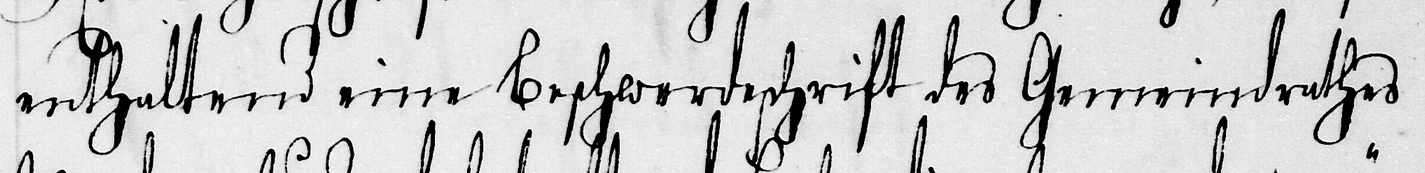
enthaltend eine Beschwerdeschrift des Gemeindrathes
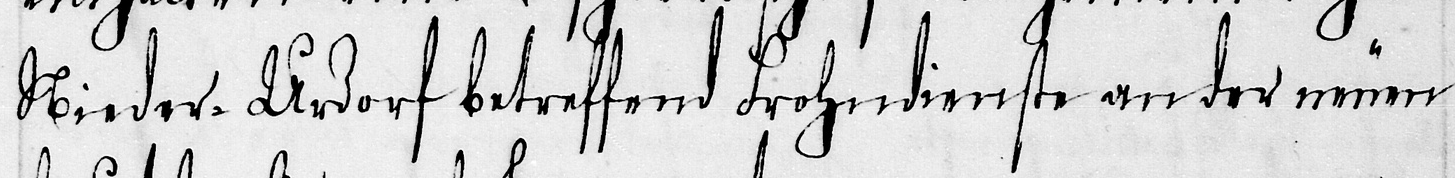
Nieder-Urdorf betreffend Frohndienste an der neuen
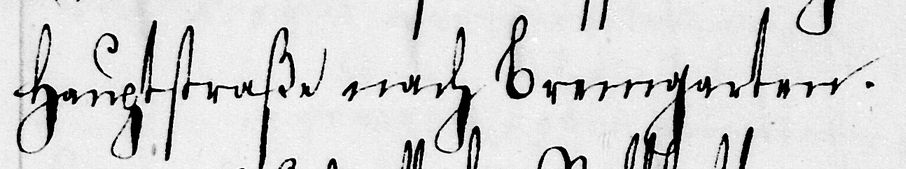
Hauptstraße nach Bremgarten.
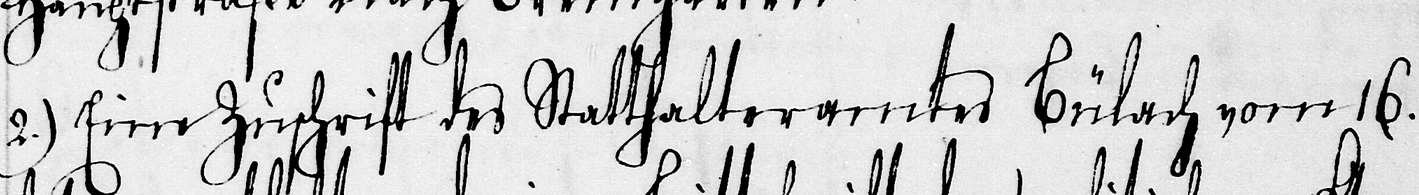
2.) Eine Zuschrift des Statthalteramtes Bülach vom 16.
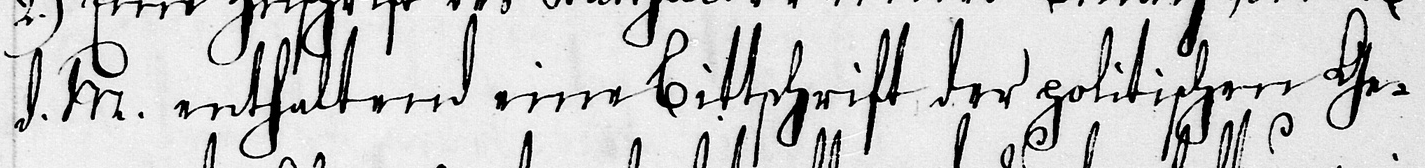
d. M. enthaltend eine Bittschrift der politischen Ge¬
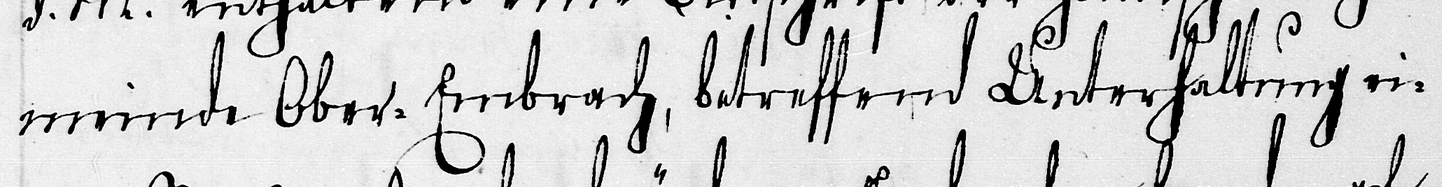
meinde Ober-Embrach, betreffend Unterhaltung ei¬
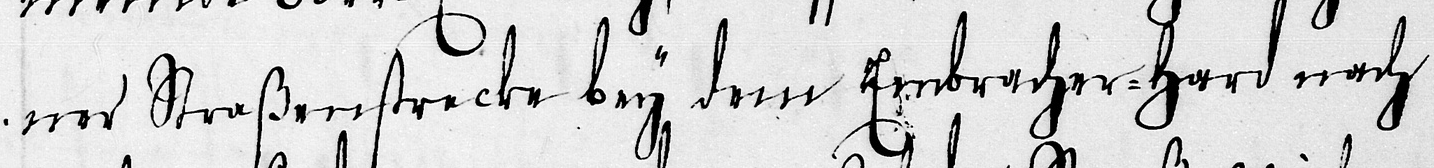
ner Straßenstrecke bey dem Embracher-Hard nach
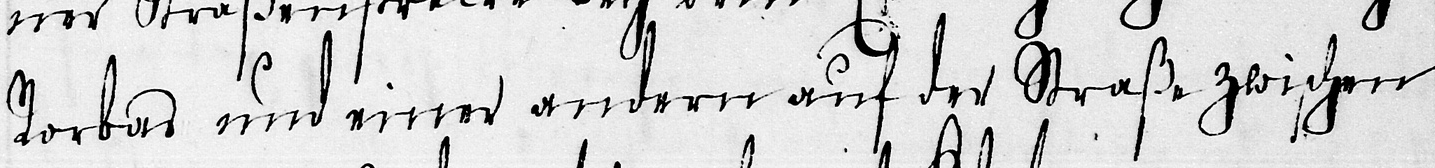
Rorbas und einer andern auf der Straße zwischen
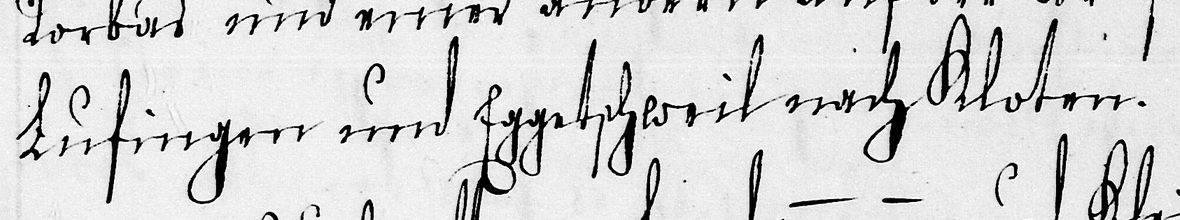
Lufingen und Eggetschweil nach Kloten.
